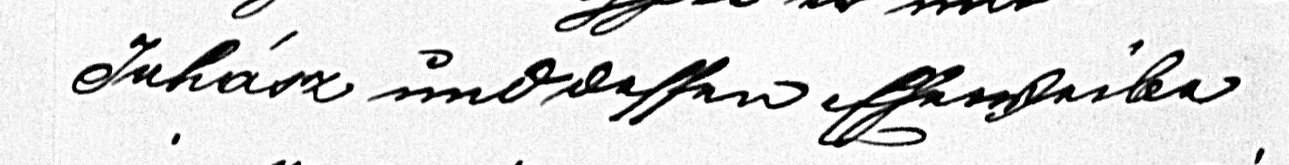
Inhász und dessen Eheweibe
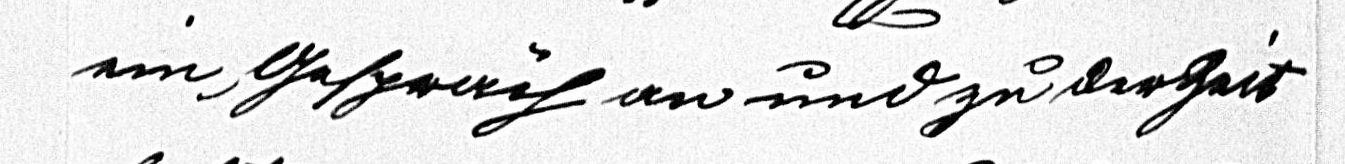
ein Gespräch an und zu der Zeit
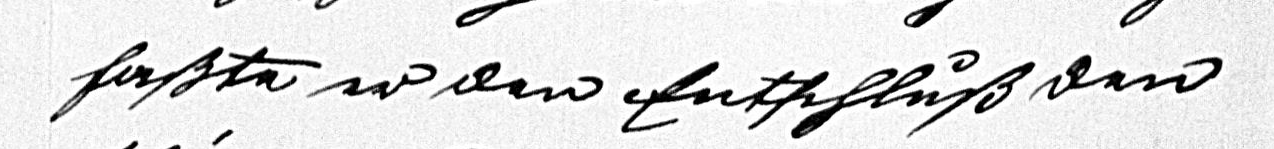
haßte er den Entschluß den
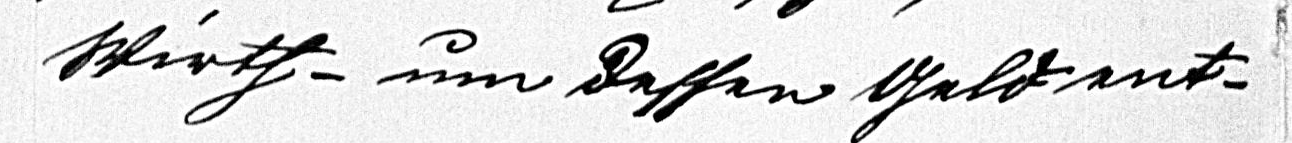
Wirth- um dessen Geld ent¬
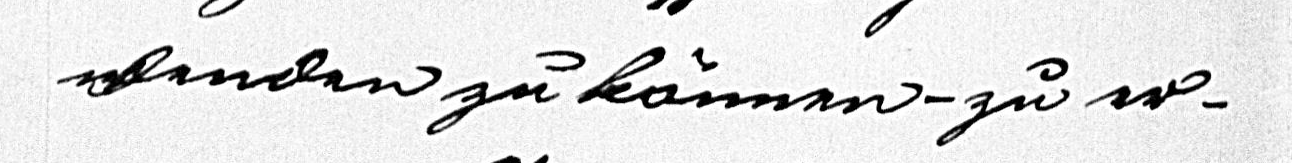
wenden zu können - zu er¬
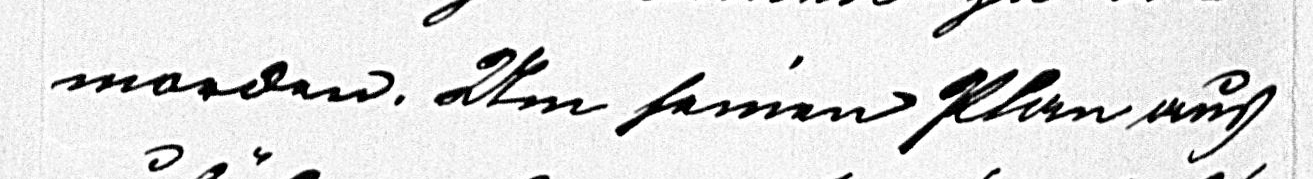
morden. Um seinen Plan aus
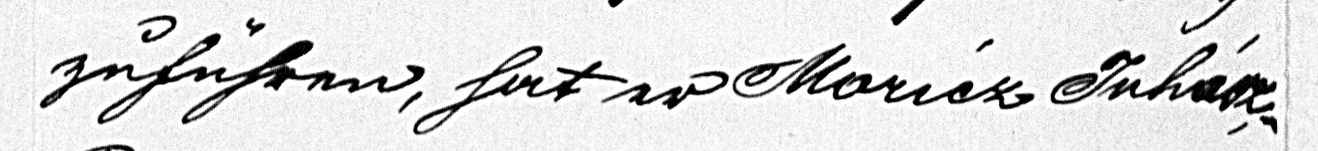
zuführen, hat er Moricz Inhász
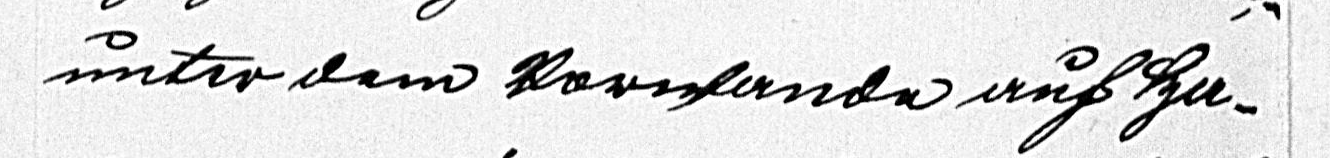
unter dem Vorwande auf Ha¬
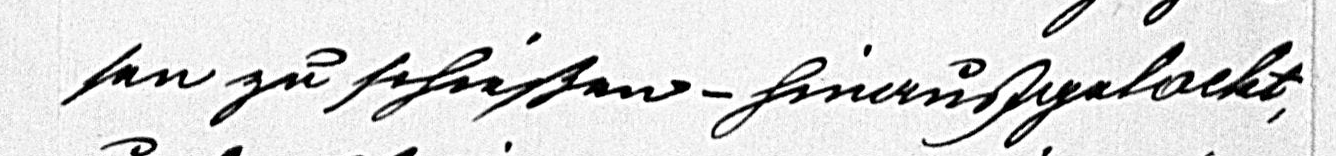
sen zu schießen - hinausgelocht,
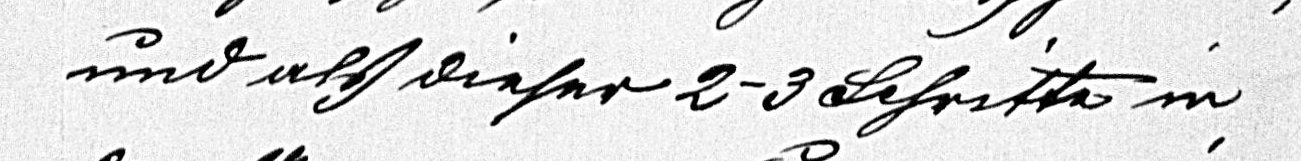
und als dieser 2-3 Schritte in
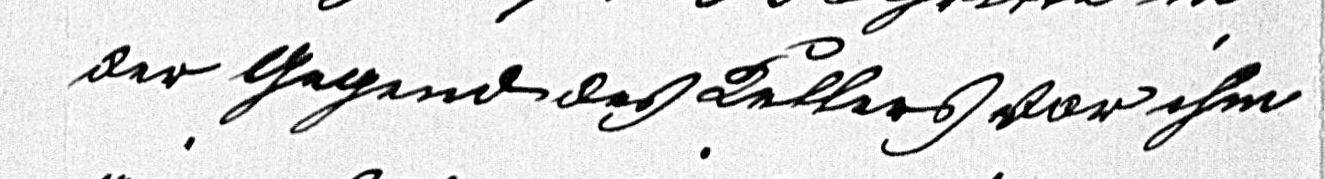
der Gegend des Kellers vor ihm
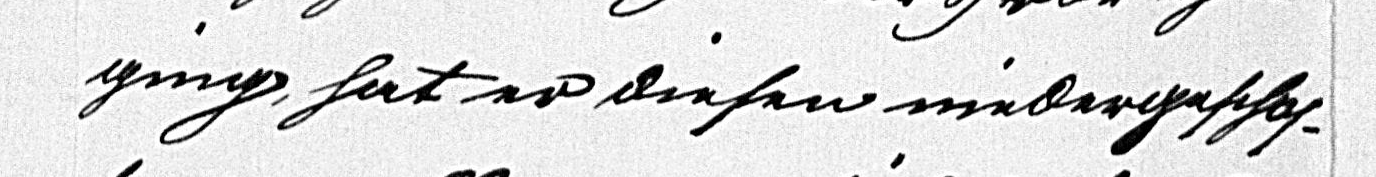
ging, hat er diesen niedergeschos¬
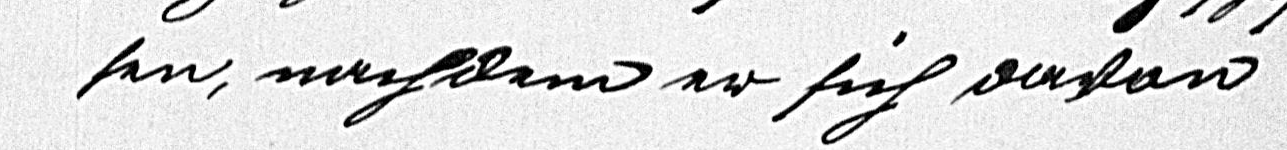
sen, nach dem er sich davon
